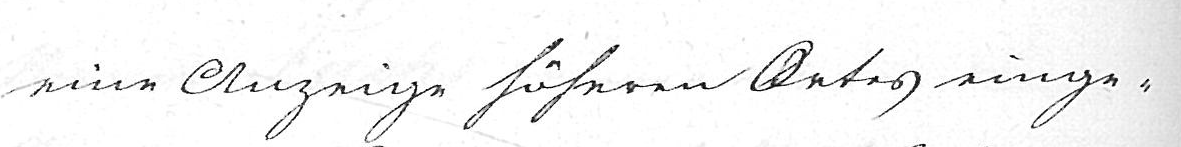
eine Anzeige höheren Ortes einge-
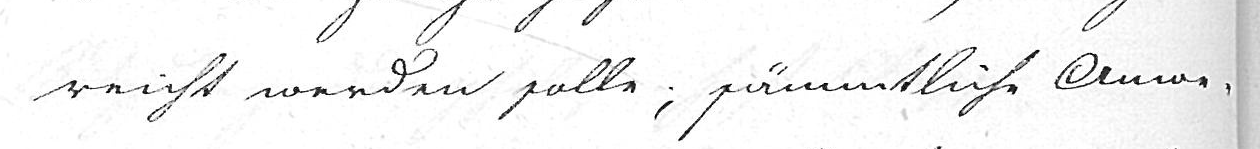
reicht werden solle; sämmtliche Anwe-
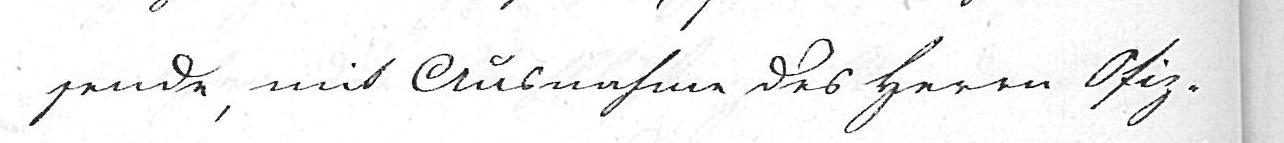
sende, mit Ausnahme des Herrn Pfiz-
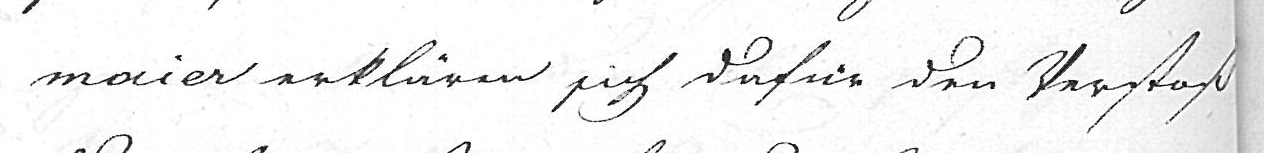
maier erklären sich dafür den Verstoß
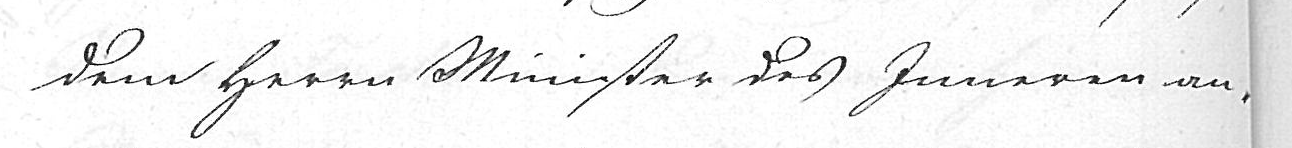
dem Herrn Minister des Inneren an-
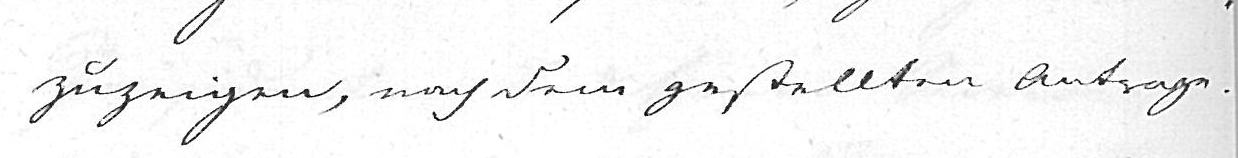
zuzeigen, nachdem gestellten Antrage.
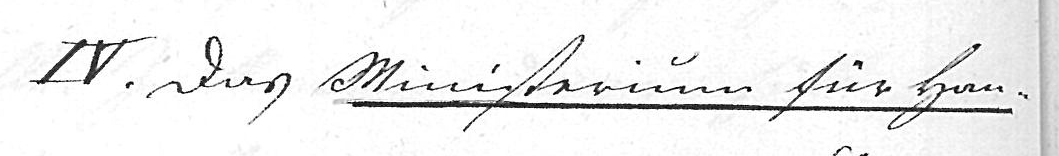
IV. Das Ministerium für Han-
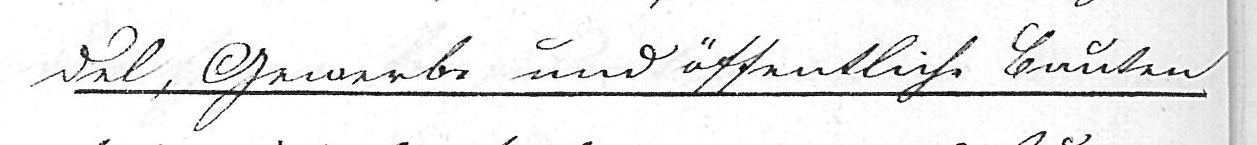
del, Gewerbe und öffentlich Bauten
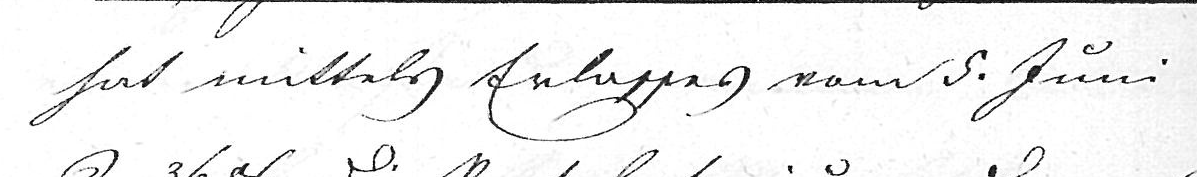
hat mittels Erlasses vom 5. Juni
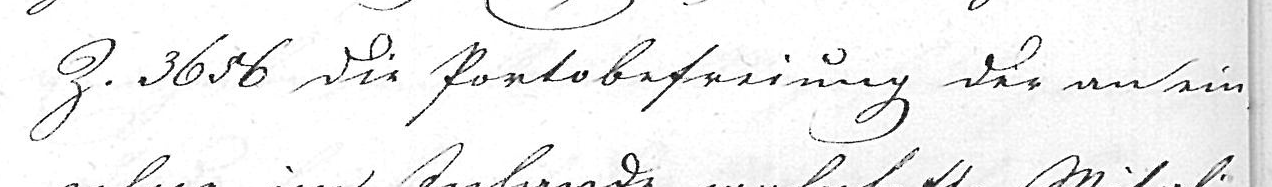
Z. 3656 die Portobefeiung der an ein-
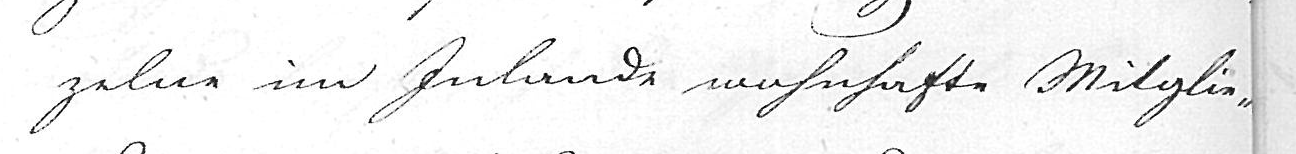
zelne im Inlande wohnhaften Mitglie-
